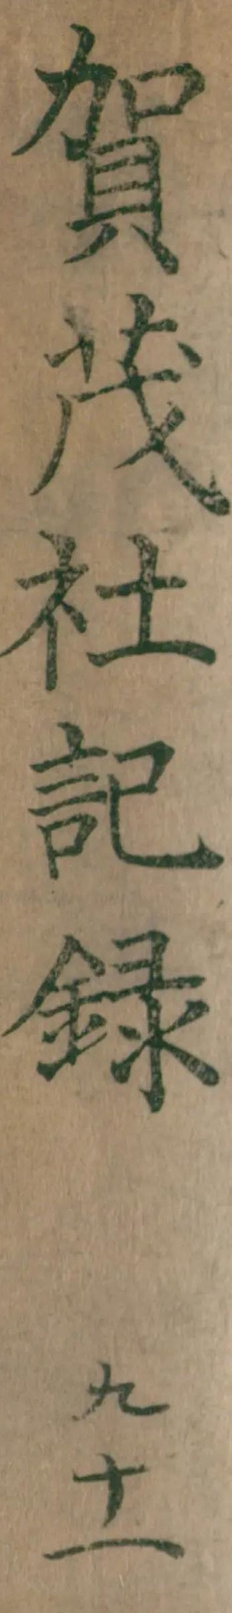賀茂社記録九十一

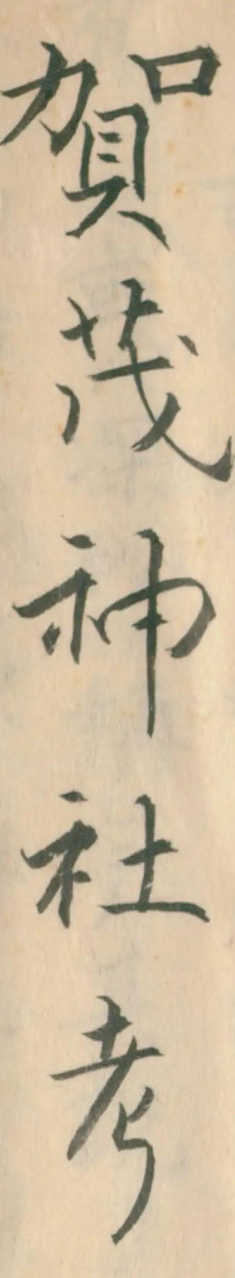賀茂神社考

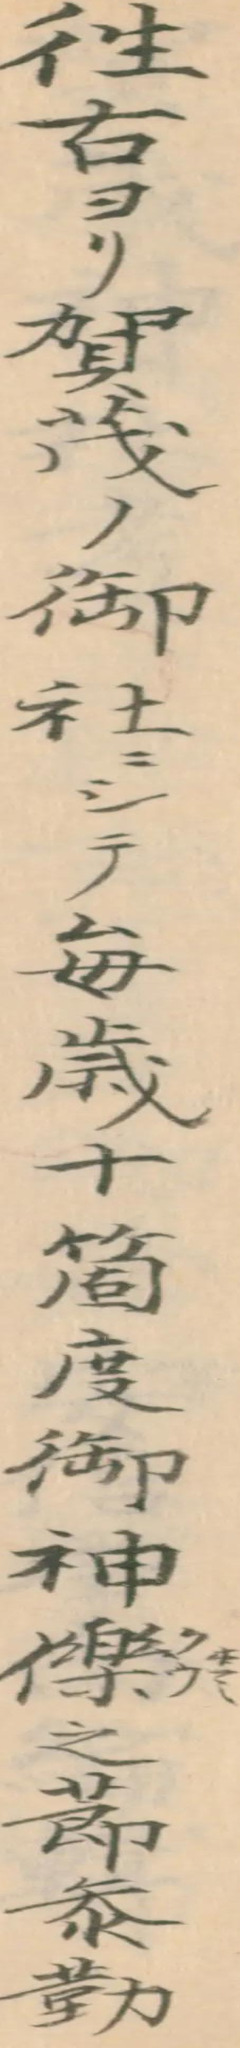往古ヨリ賀茂ノ御社ニシテ毎歳十箇度御神楽之節参勤
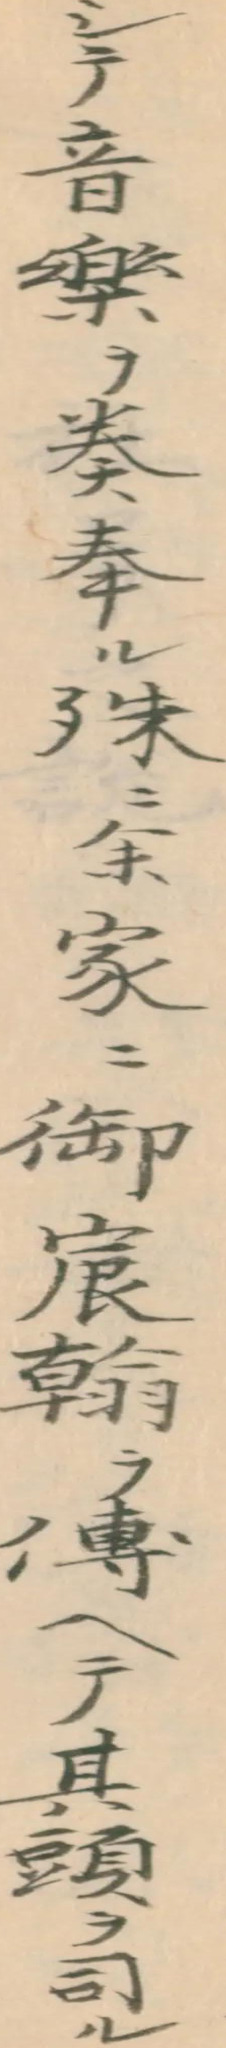シテ音楽ヲ奏奉ル殊ニ余家ニ御宸翰ヲ伝へテ其頭ヲ司ル
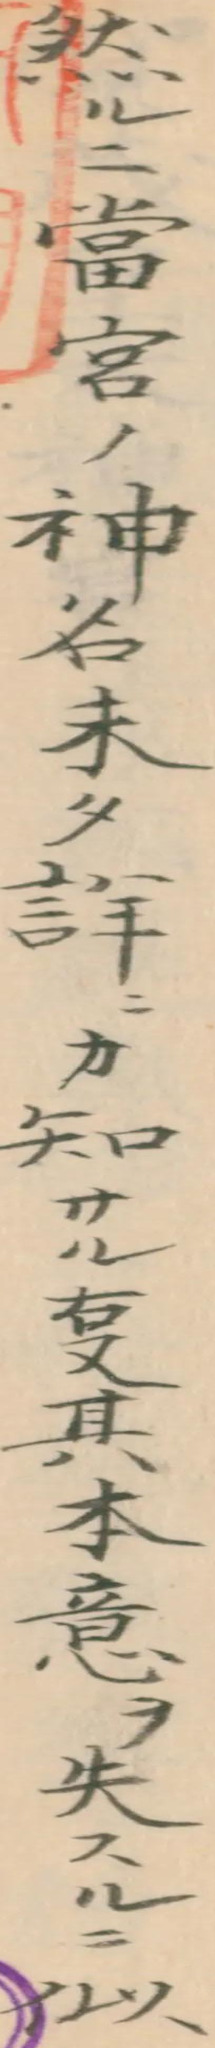然ルニ当宮ノ神名未タ詳ニカ知サル事其本意ヲ失スルニ似
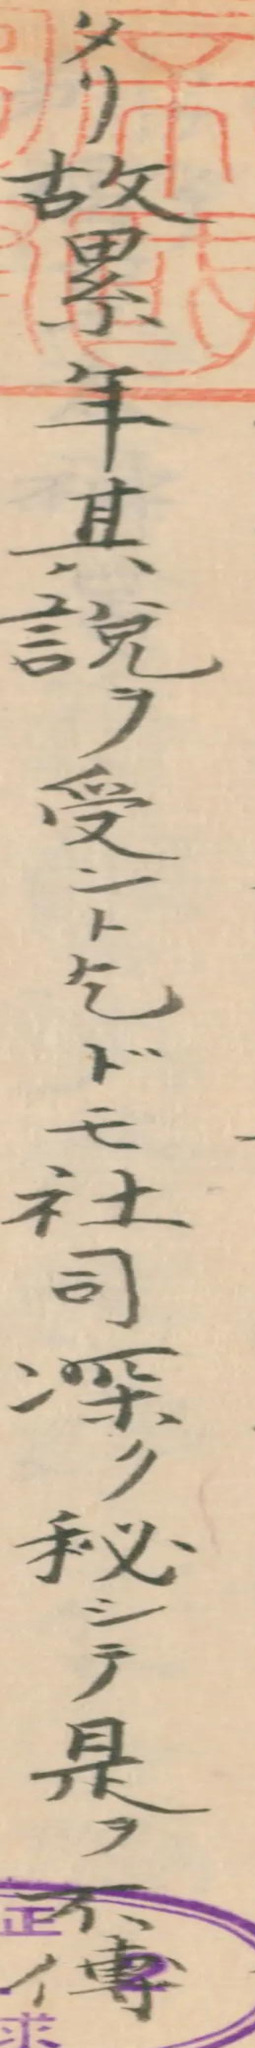タリ故累年其説ヲ受ント乞ドモ社司深ク秘シテ是ヲ不伝
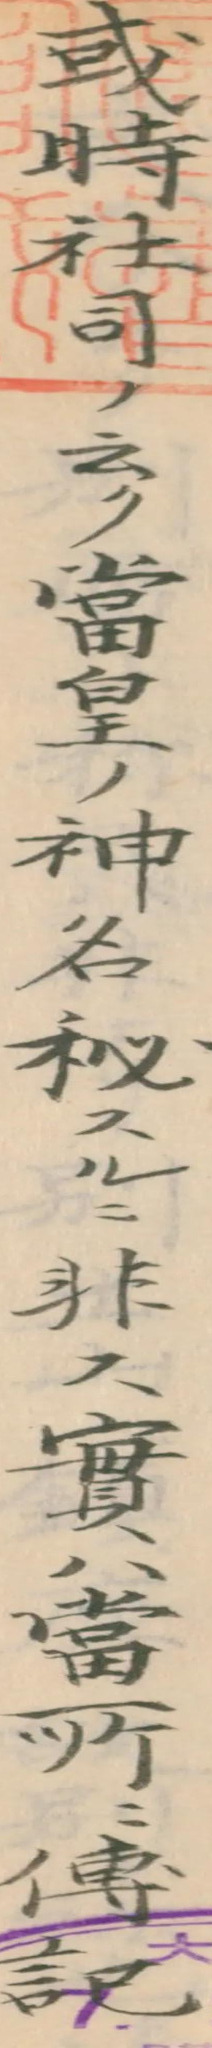或時社司ノ云ク当皇ノ神名秘スルニ非ス実ハ当所ニ伝記
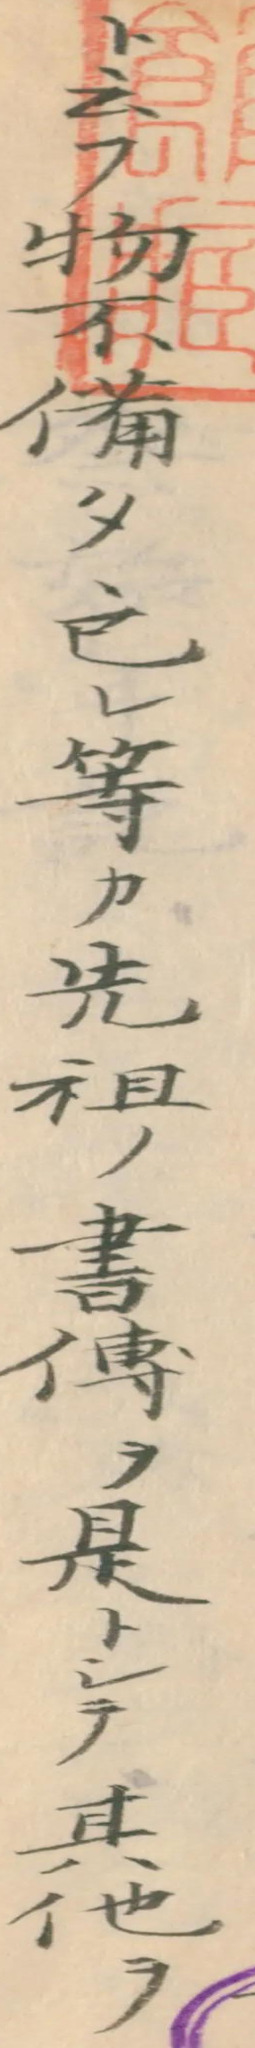ト云フ物不備タヽ己レ等カ先祖ノ書伝ヲ是トシテ其他ヲ
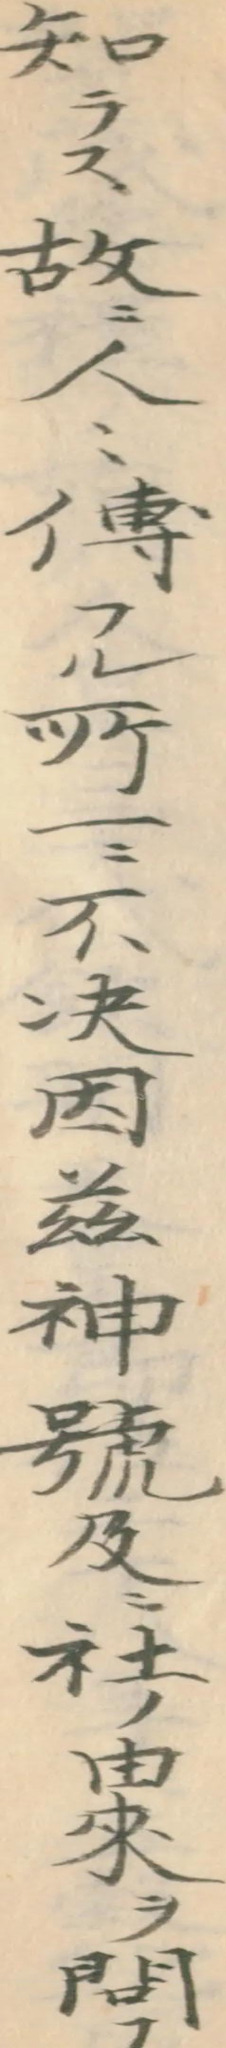知ラス故ニ人々伝フル所一ニ不決因茲神号及ニ社ノ由来ヲ問フ
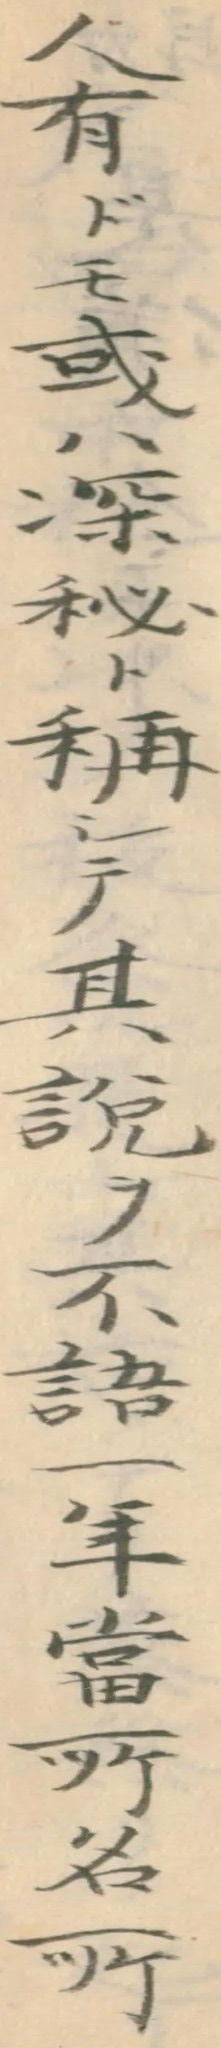人有ドモ或ハ深秘ト称シテ其説ヲ不語一年当所名所
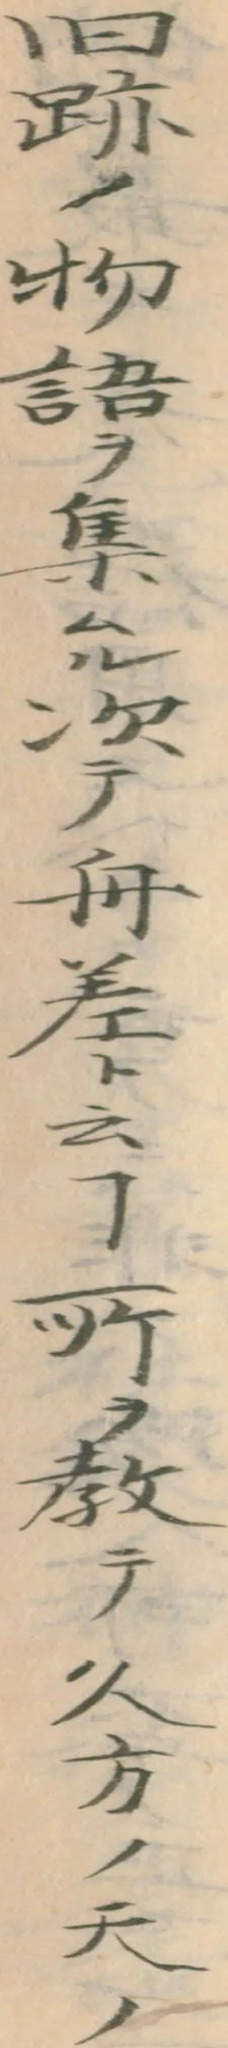旧跡ノ物語ヲ集ムル次テ舟差ト云コト所ヲ教テ久方ノ天ノ
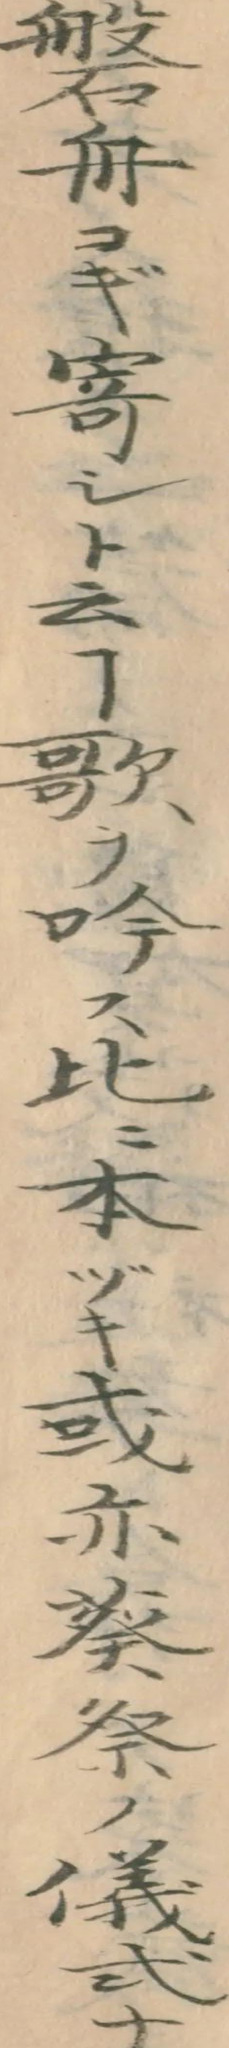磐舟コギ寄シト云コト歌ヲ吟ス比ニ本ヅキ或亦葵祭ノ儀式ナ

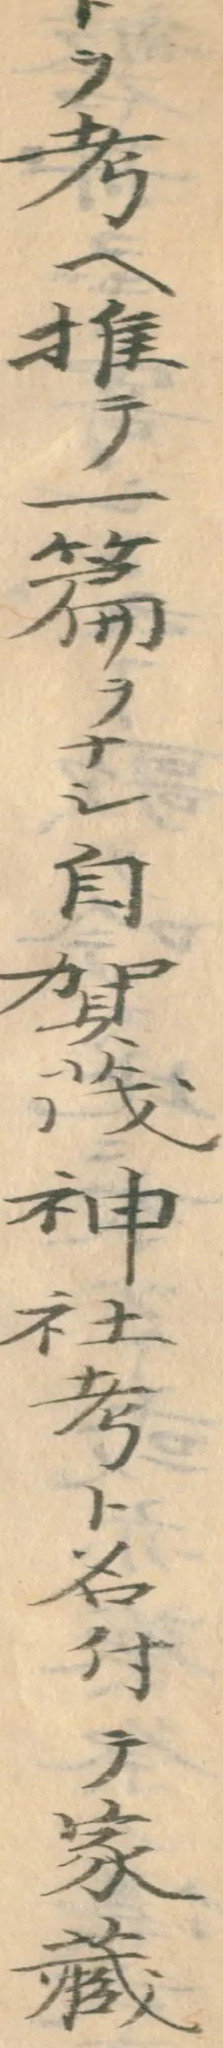トヲ考ヘ推テ一篇ヲナシ自賀茂神社考ト名付テ家蔵ニ
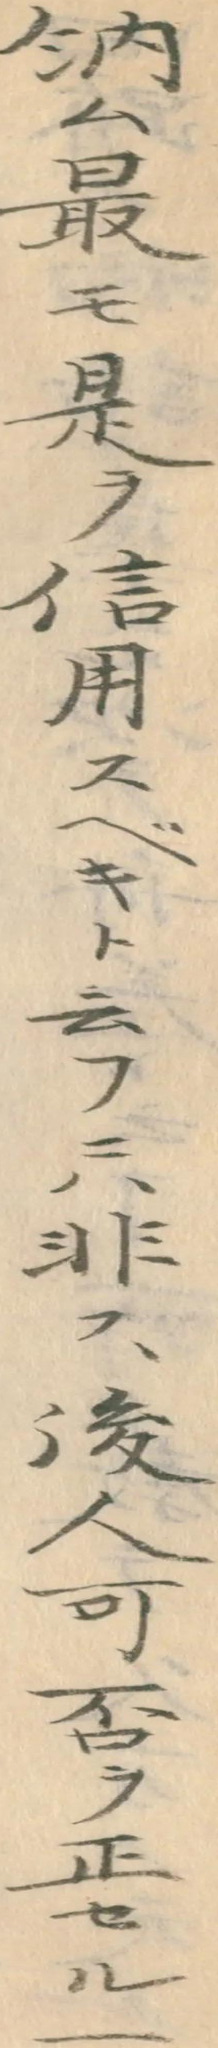納ム最モ是ヲ信用スベキト云フニハ非ス後人可否ヲ正セル一
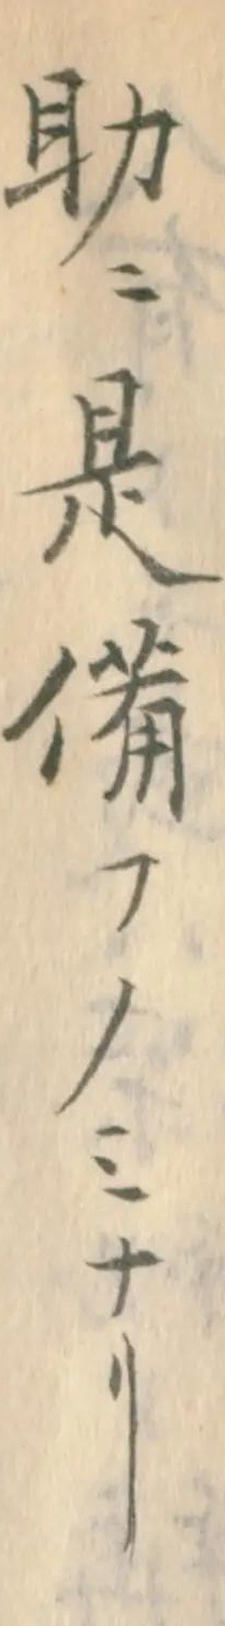助ニ是備フノミナリ
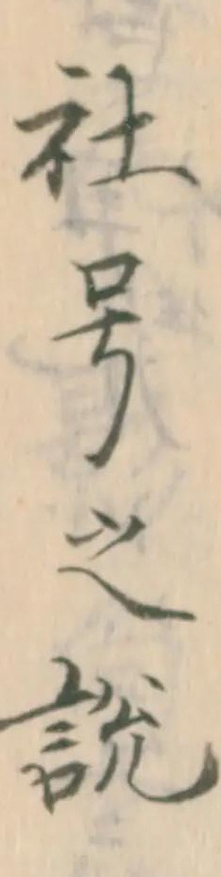社号之説
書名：賀茂社記録. 第91冊
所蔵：国立国会図書館 National Diet Library, JAPAN
